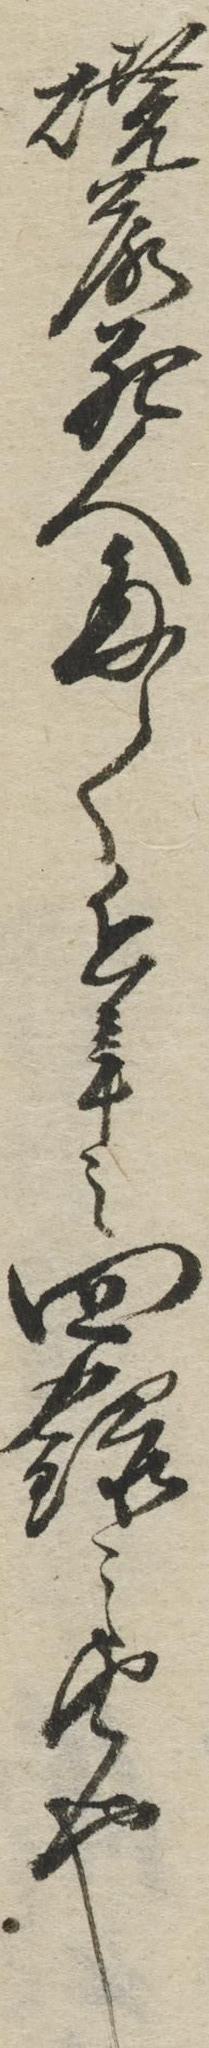焼落死人多く近年之四難之由也
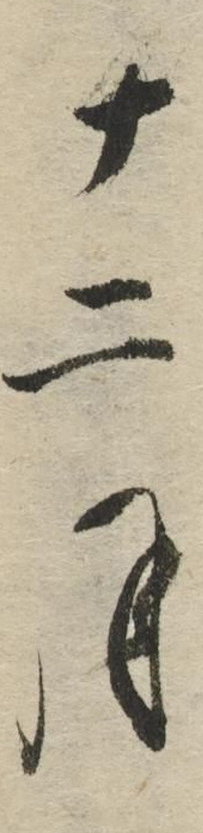十二月

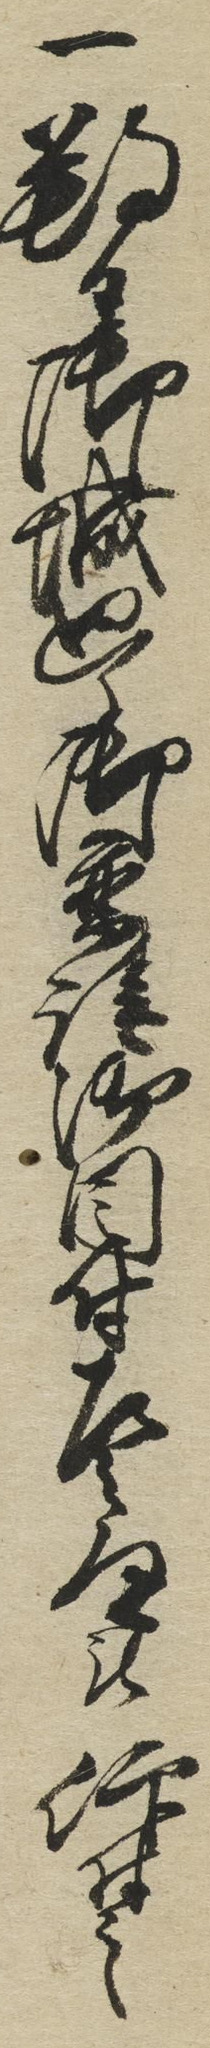一朔日御城廻御普請御目付左之通被仰付之
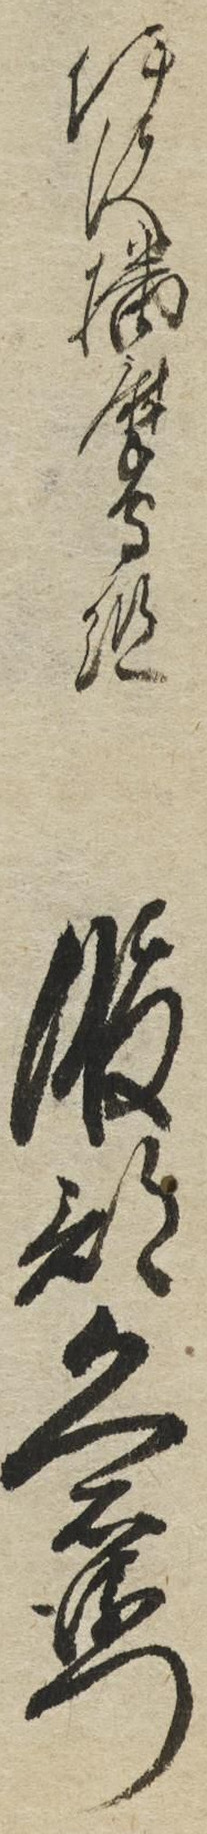伊沢播磨守組服部久右衛門
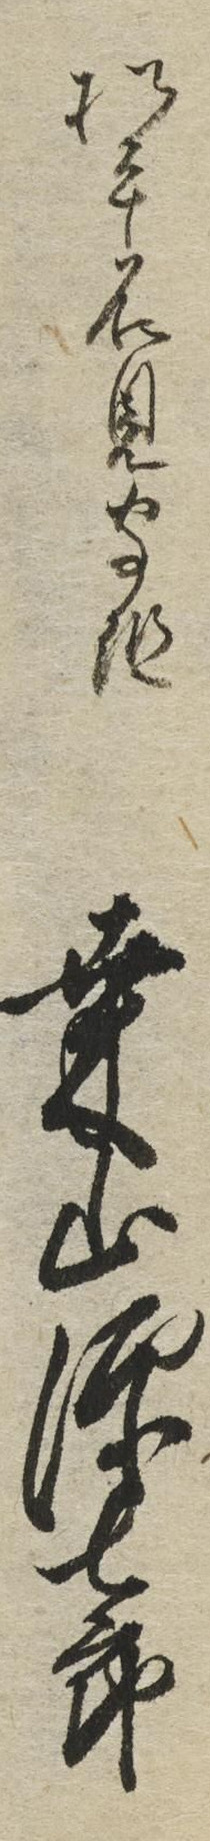松平石見守組桑山源七郎
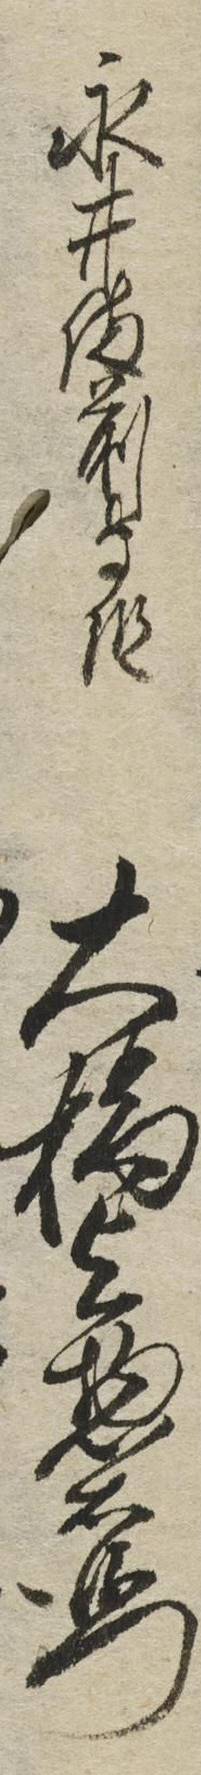永井備前守組大橋与惣右衛門
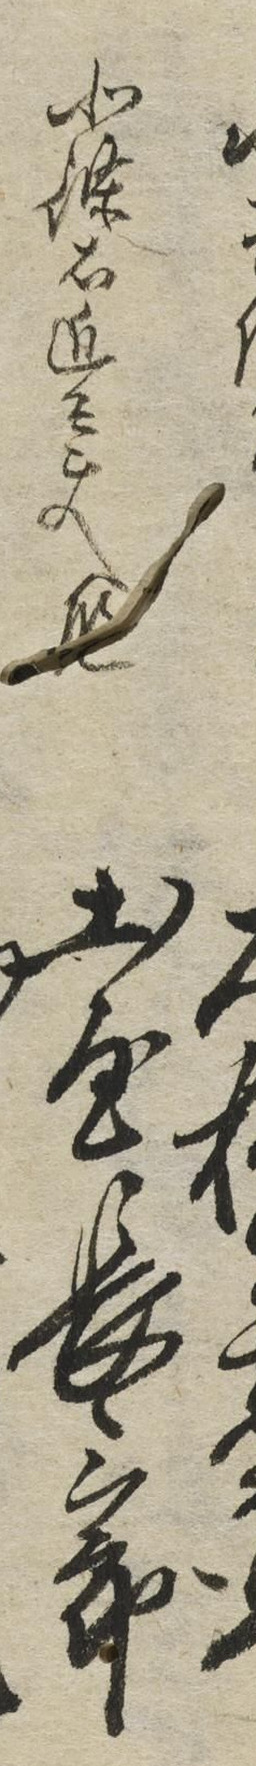北條右近太夫組土屋長三郎
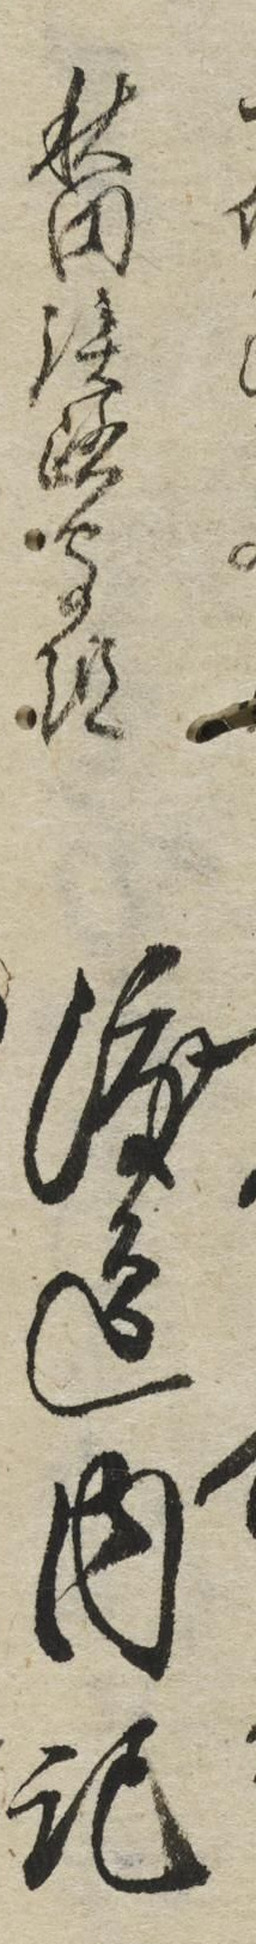秋田淡路守組渡辺内記
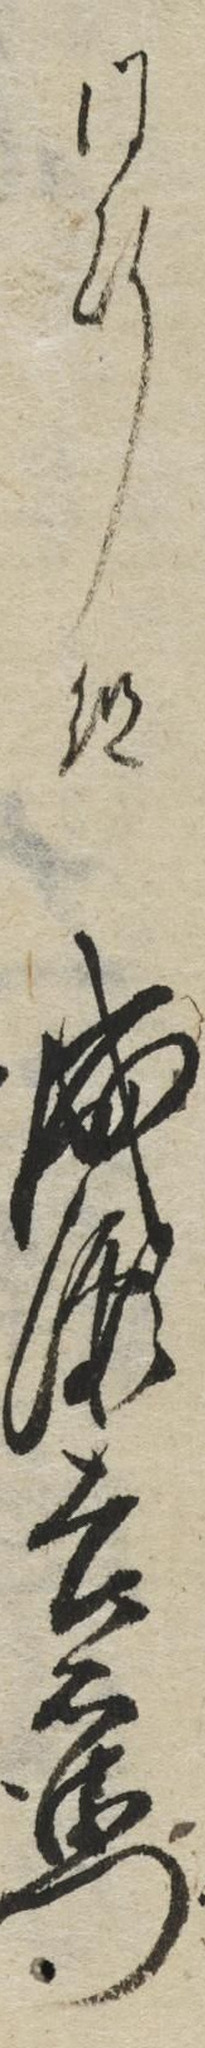同断組成瀬兵右衛門
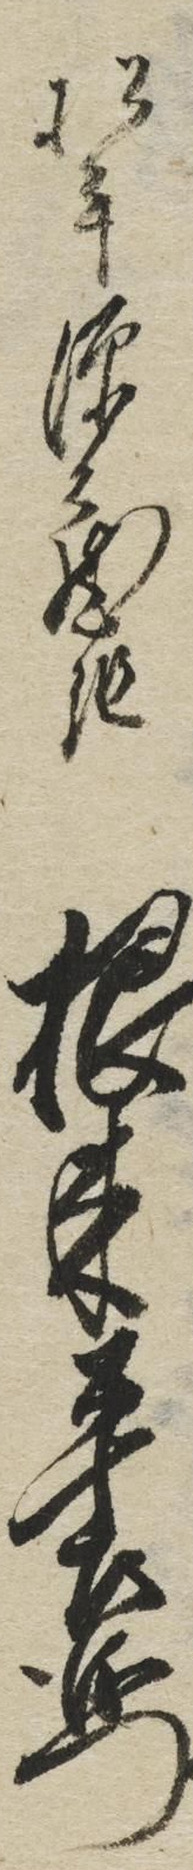松平源兵衛組根来平左衛門
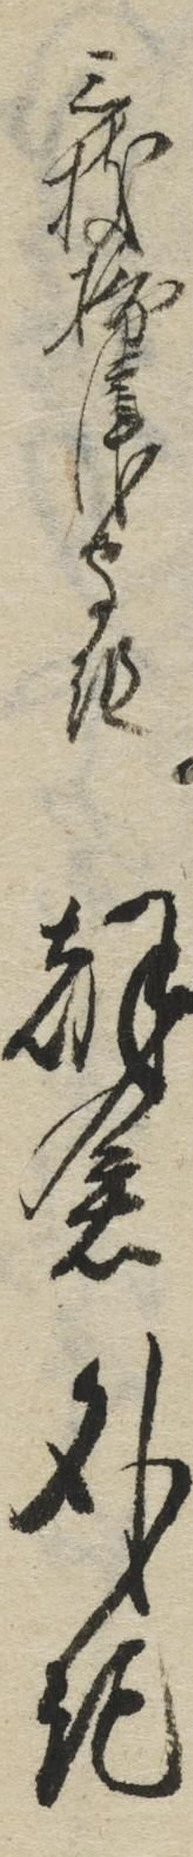三枝摂津守組都倉外記
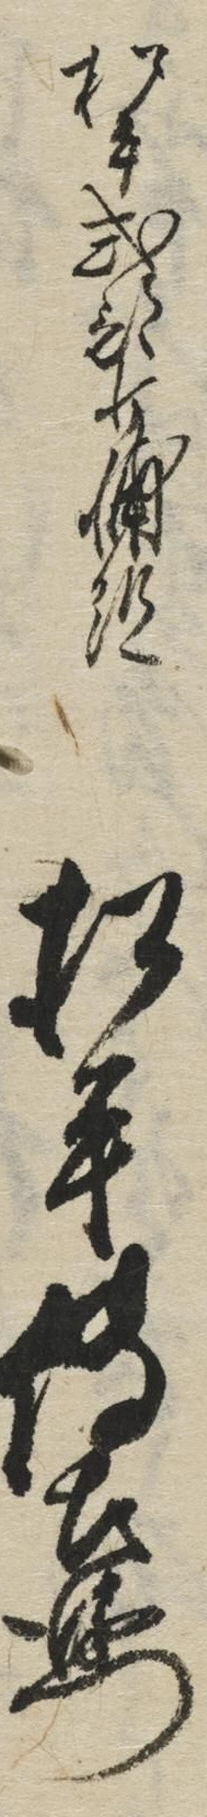松平式部少輔組松平伝左衛門
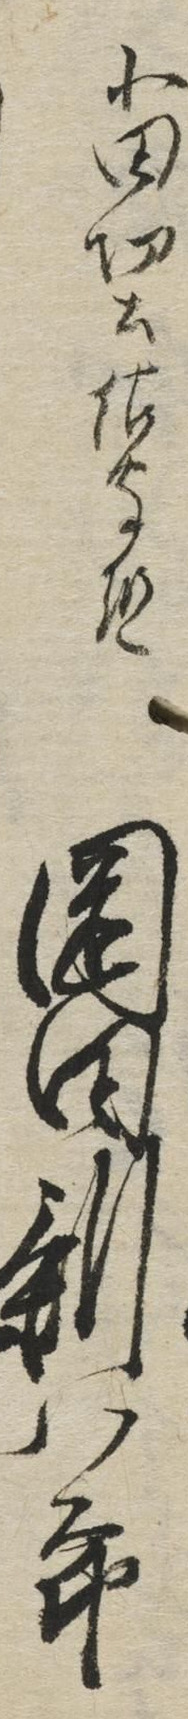小田切土佐守組岡田新八郎
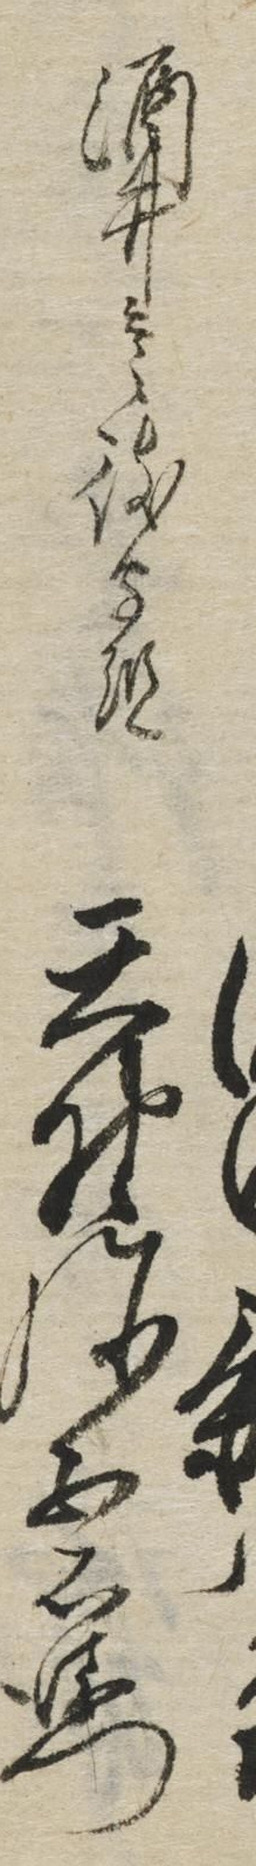酒井壱岐守組天野弥五右衛門
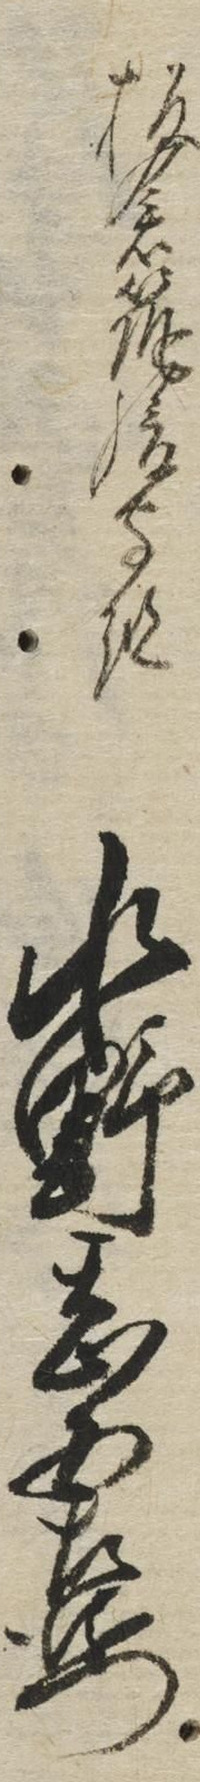板倉築後守組水野甚五左衛門
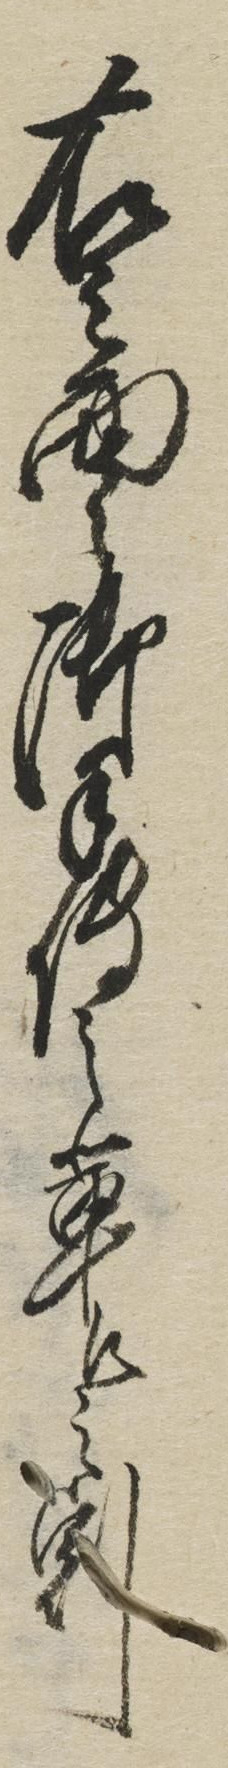右之面々御手伝之輩江之割
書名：元禄地震記
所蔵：東京大学地震研究所図書室 Earthquake Research Institute Library, The University of Tokyo, JAPAN
